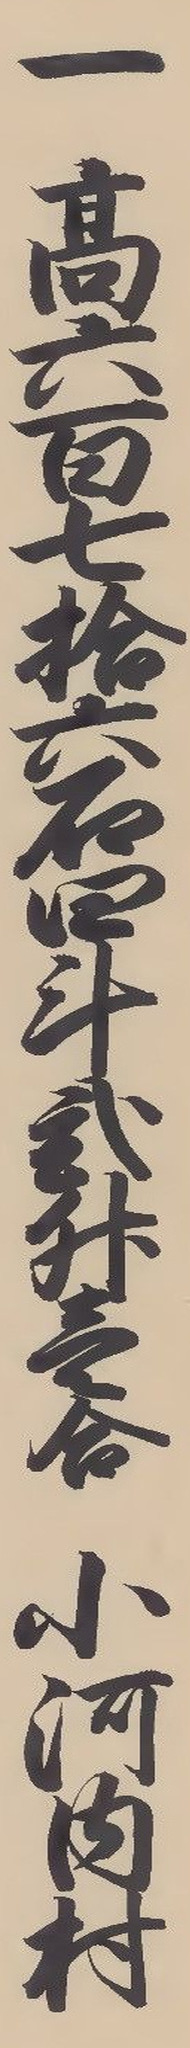一高六百七拾六石四斗弐升壱合小河内村
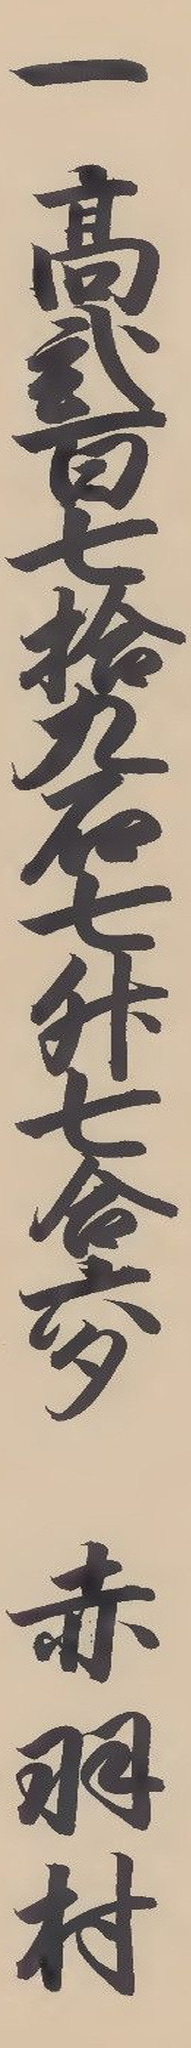一高弐百七拾九石七升七合六勺赤羽村
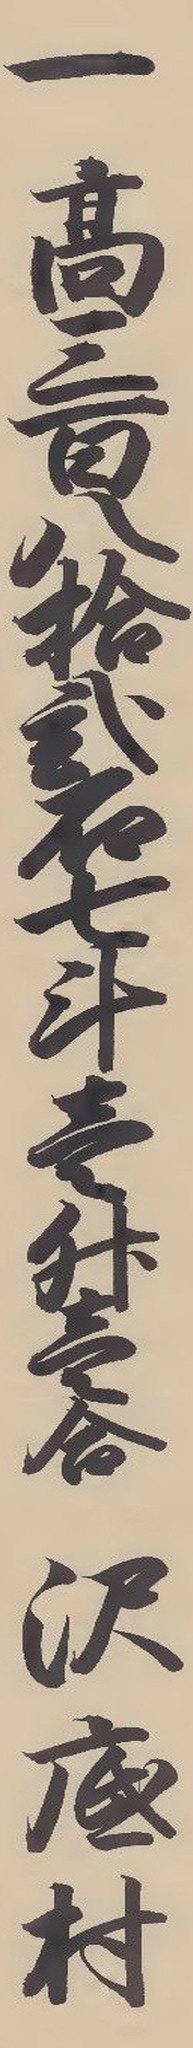一高三百八拾弐石七斗壱升壱合沢底村
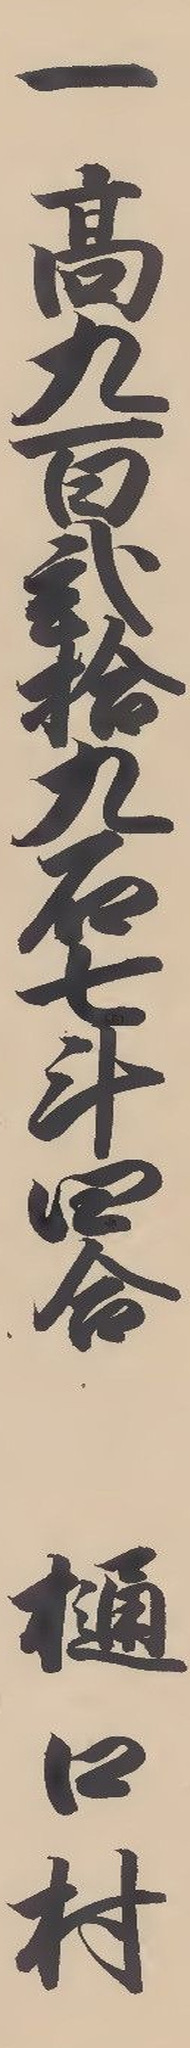一高九百弐拾九石七斗四合樋口村
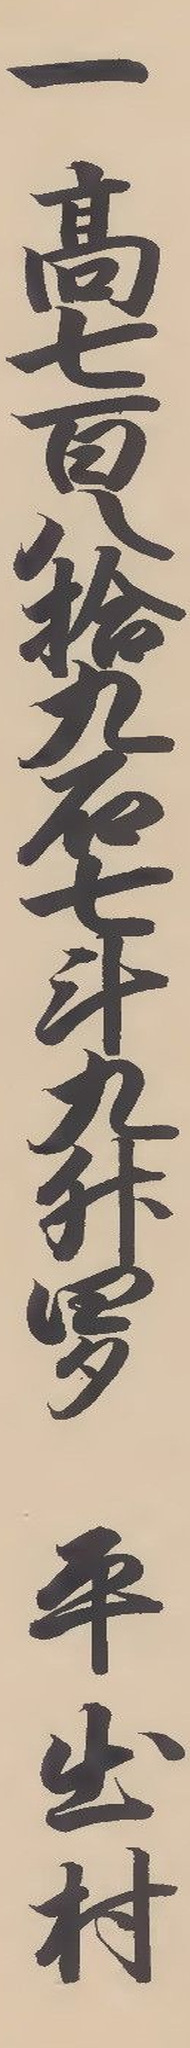一高七百八拾九石七斗九升四勺平出村
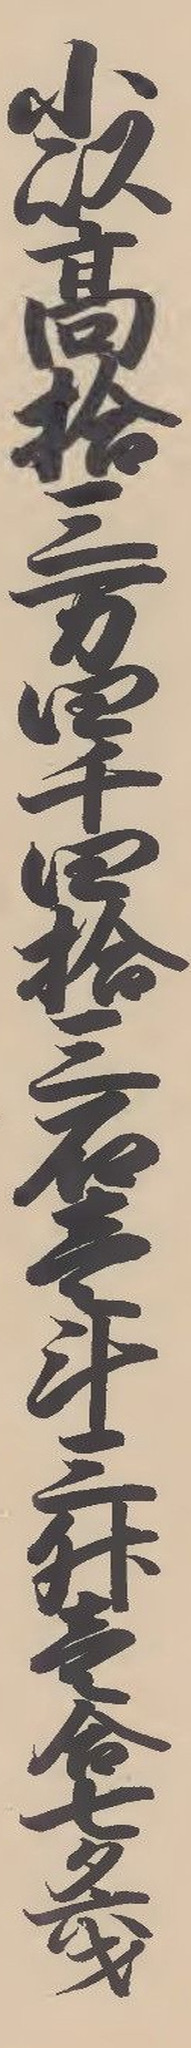小以高拾三万四千四拾三石壱斗三升壱合七勺六才

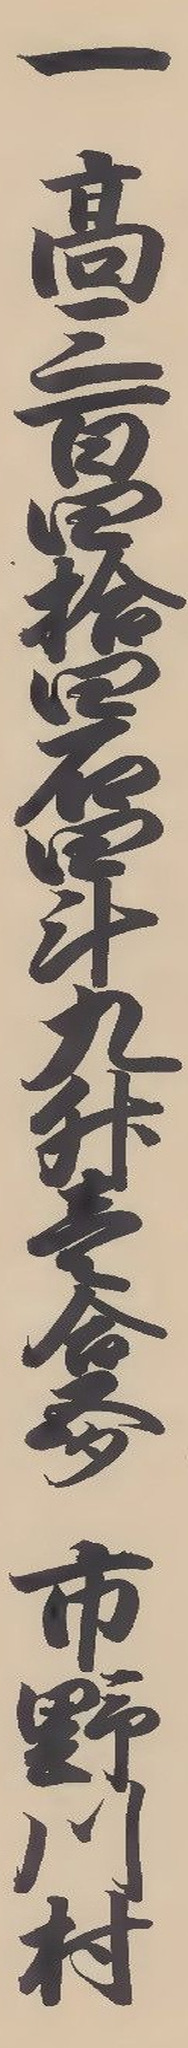一高三百四拾四石四斗九升壱合五勺市野川村
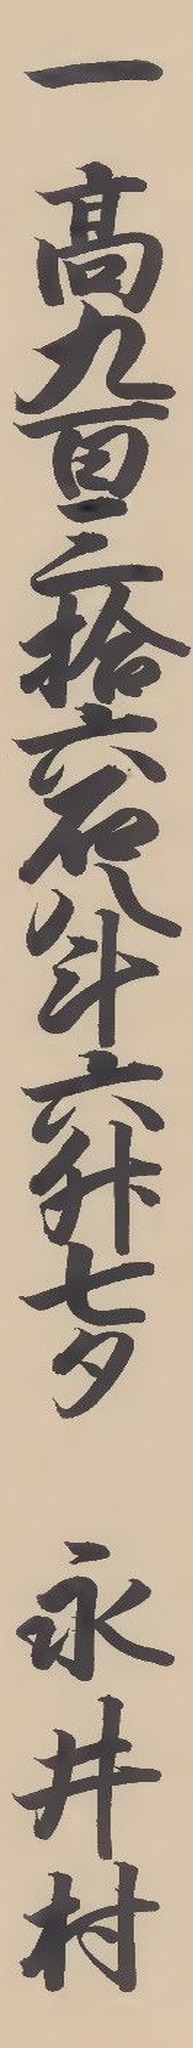一高九百三拾六石八斗六升七勺永井村
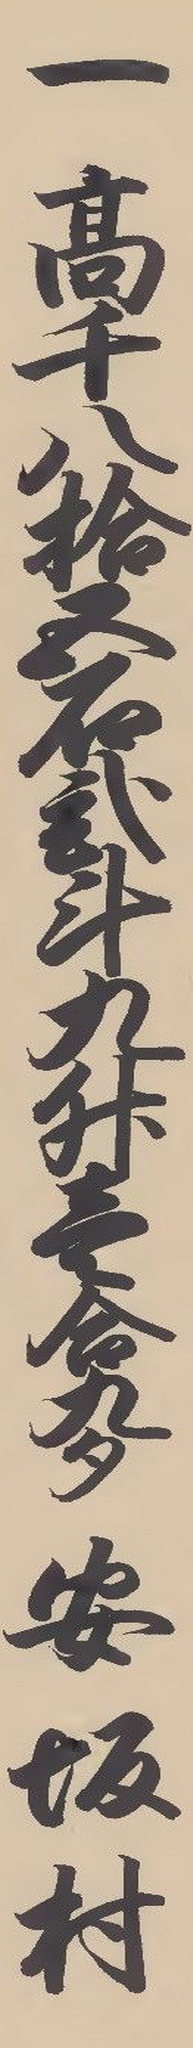一高千八拾五石弐斗九升壱合九勺安坂村
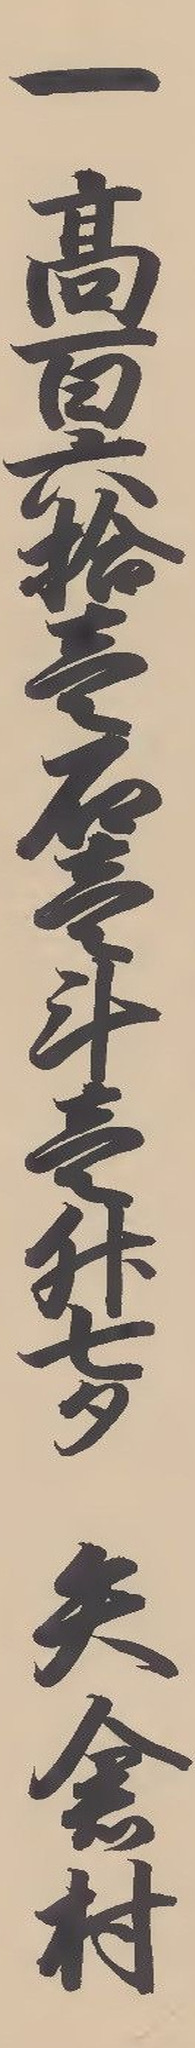一高百六拾壱石壱斗壱升七勺矢倉村
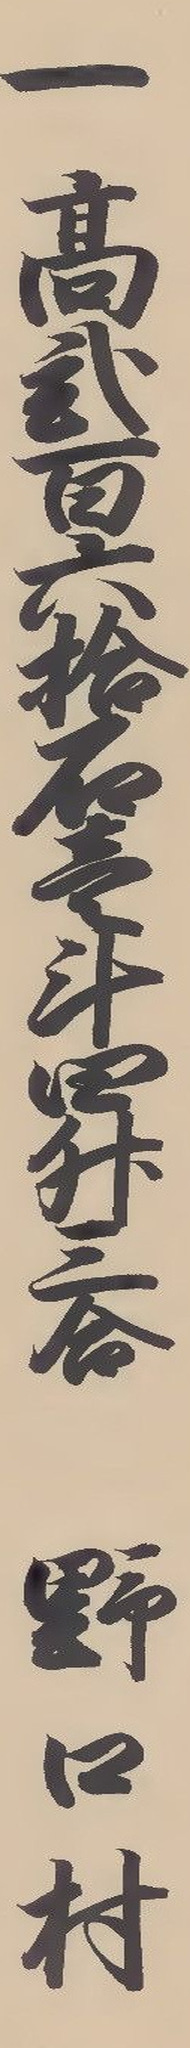一高弐百六拾石壱斗四升三合野口村
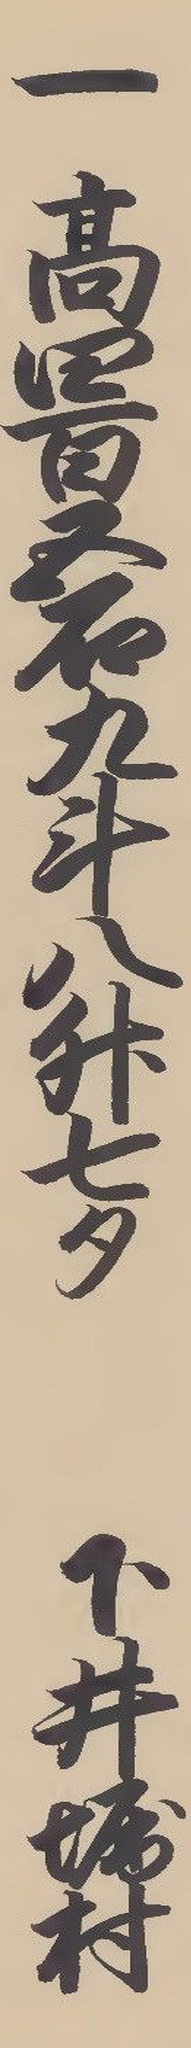一高四百五石九斗八升七勺下井堀村
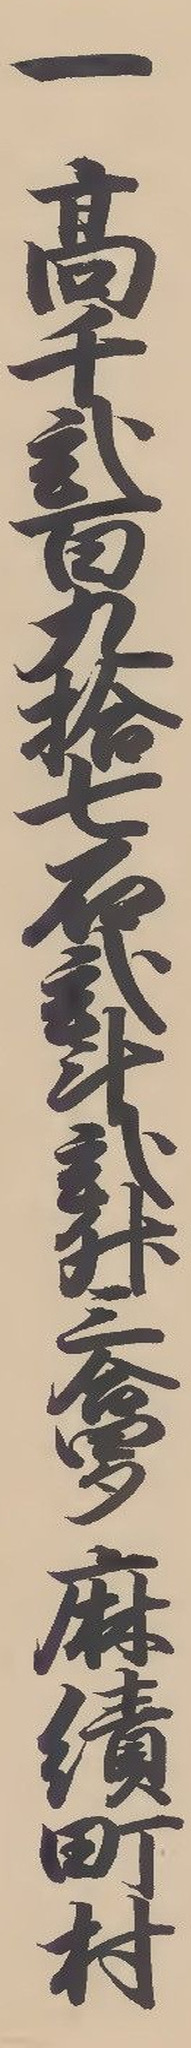一高千弐百九拾七石弐斗弐升三合四勺麻績町村

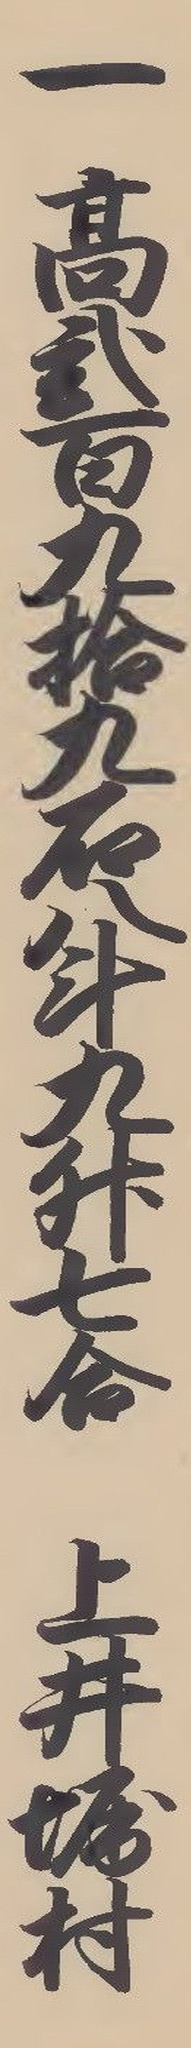一高弐百九拾九石八斗九升七合上井堀村
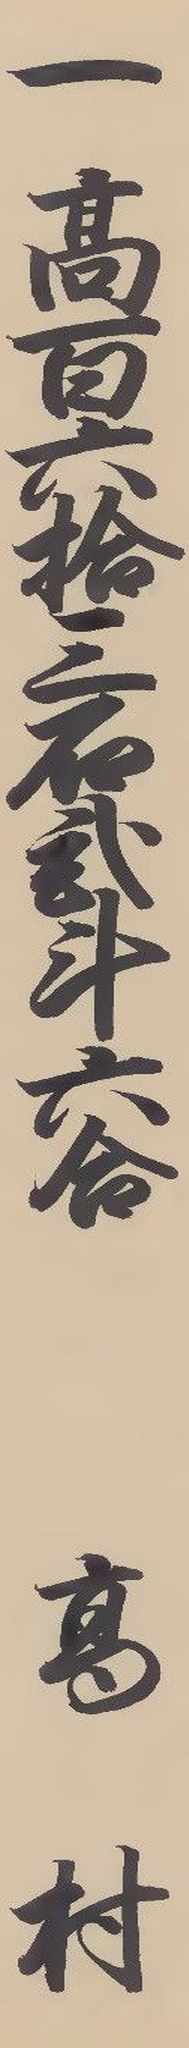一高百六拾三石弐斗六合高村
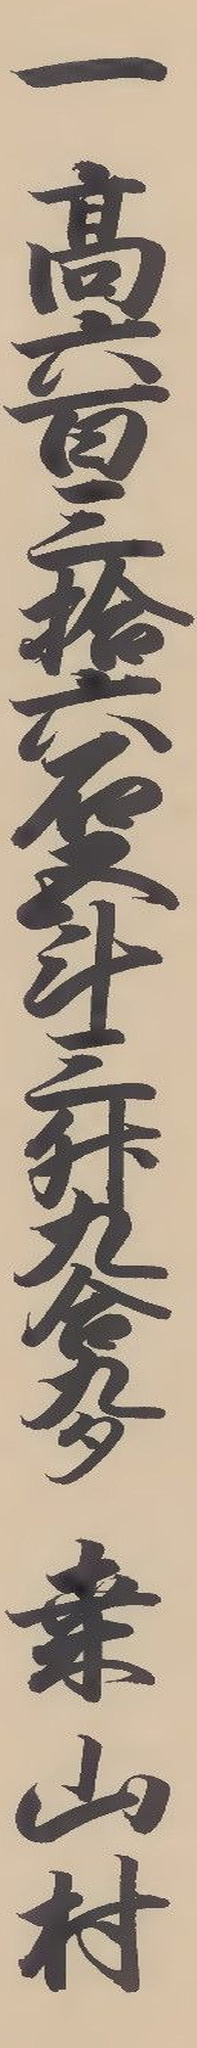一高六百三拾六石五斗三升九合九勺桑山村
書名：信濃国郷帳
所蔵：国立公文書館 National Archives of Japan
